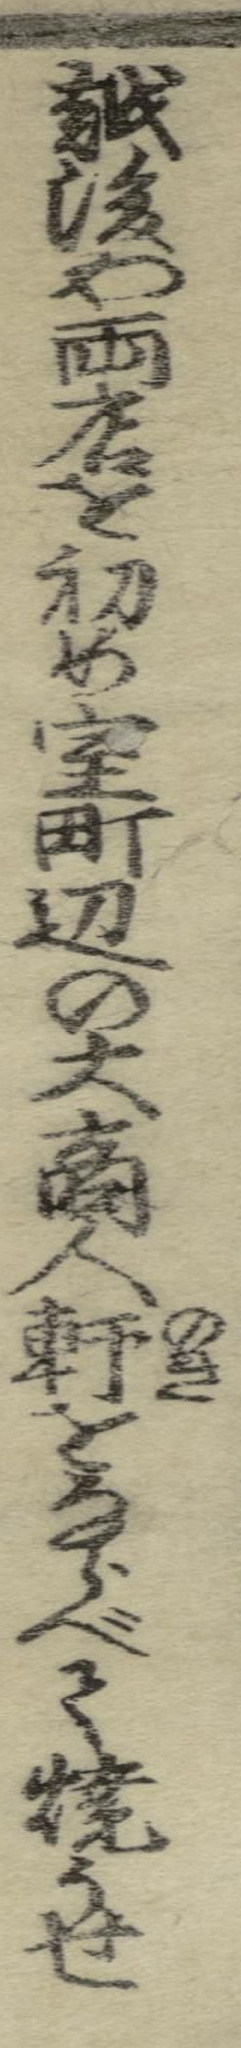越後屋両店を初め室町辺の大商人軒をならべて焼うせ
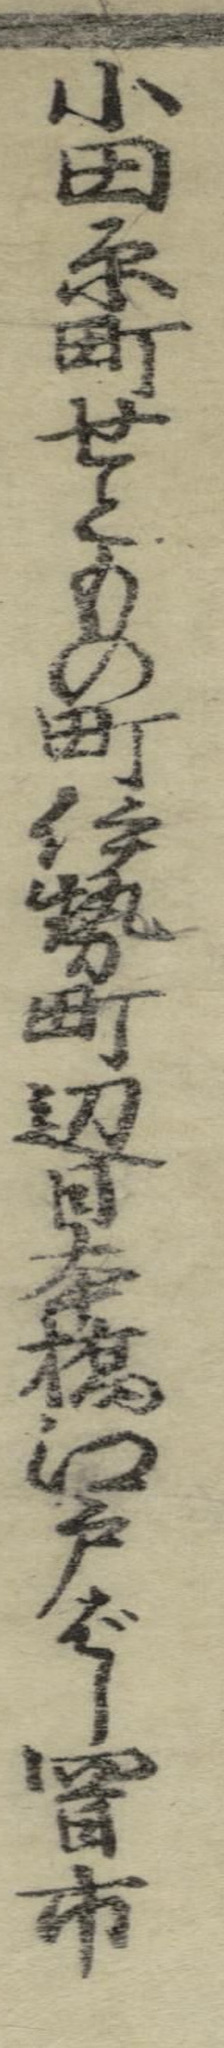小田原町せともの町伊勢町辺日本橋江戸ばし四日市
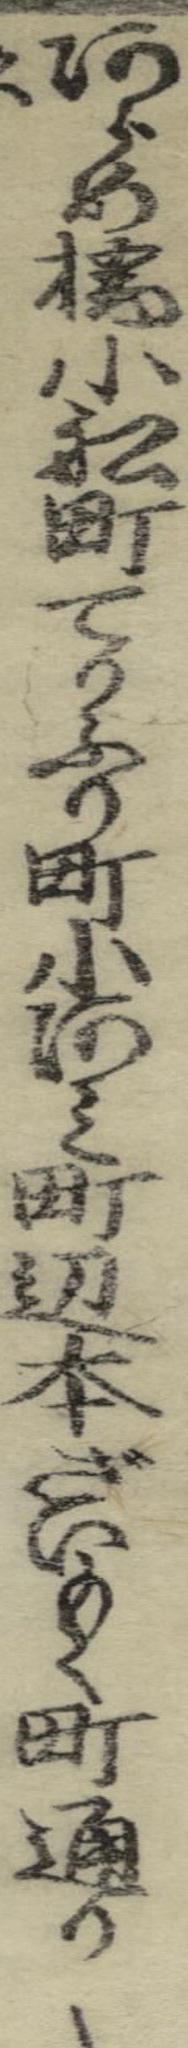あらめ橋小松町てりふり町小あみ町辺本ざいもく町通り
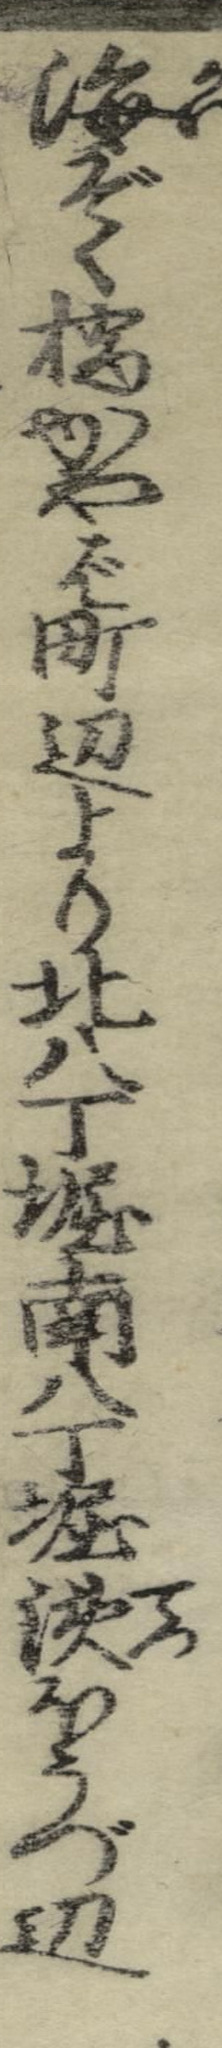海ぞく橋かやば町辺より北八丁堀南八丁堀鉄ほうづ辺
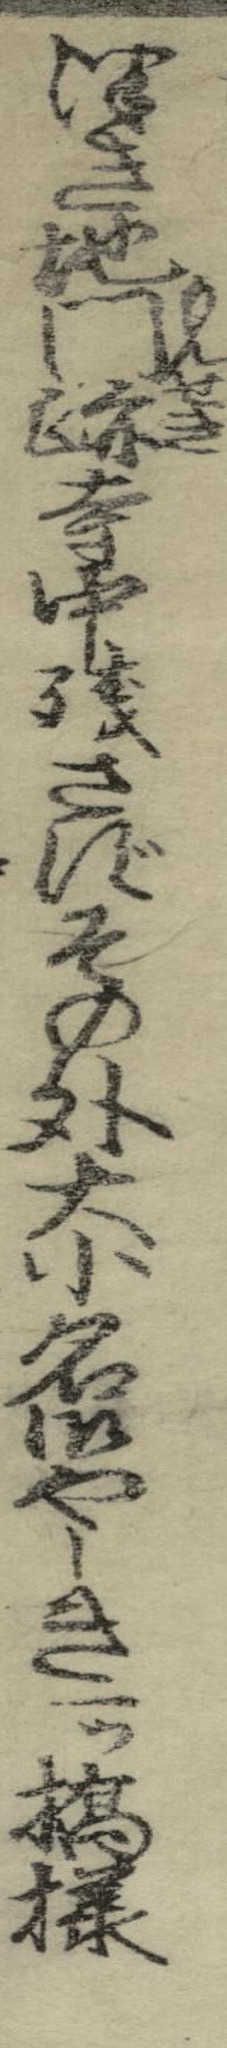つき地門跡寺中残さずその外大小名御やしき一ッ橋様
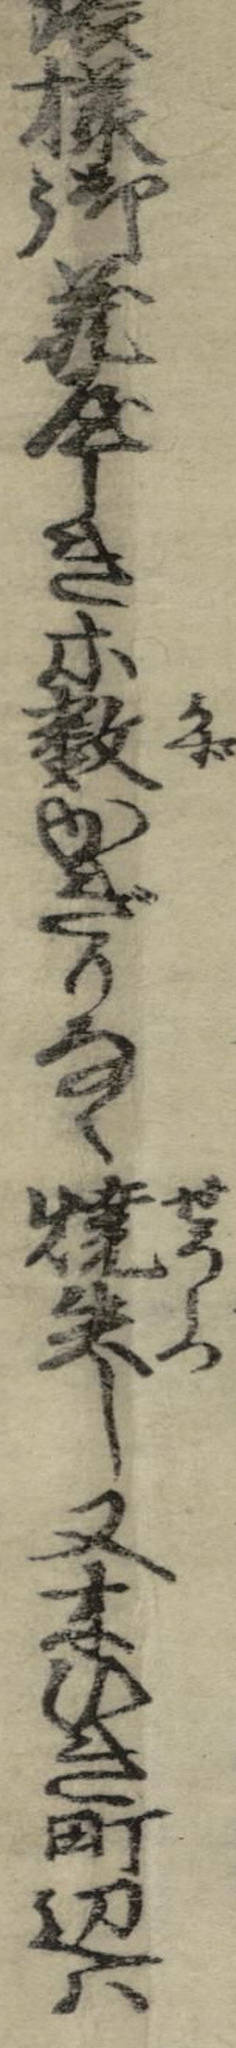尾張様御蔵屋しき等数かぎりなく焼失し又木ひき町辺は
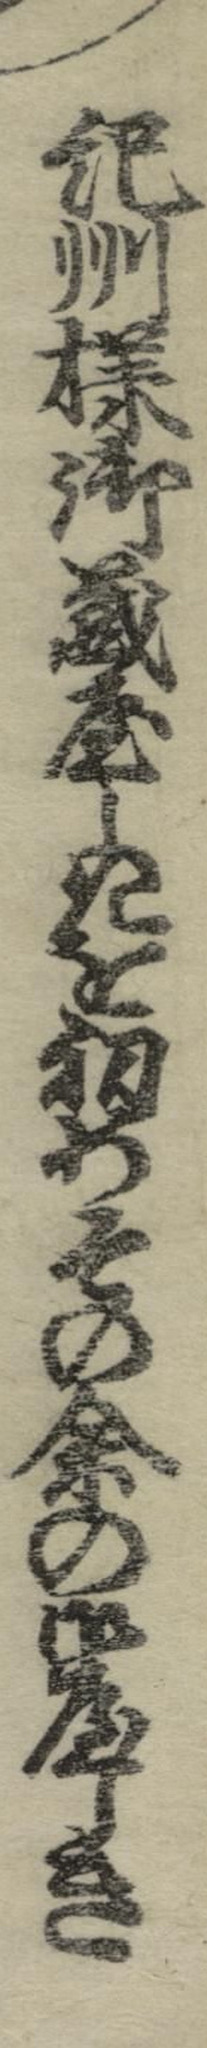紀州様御蔵屋しきを初めその余の御屋しき
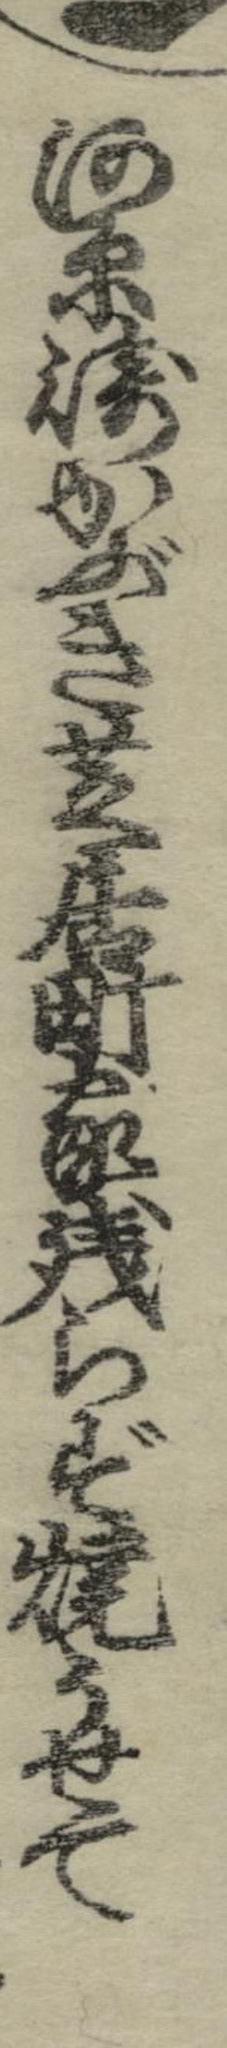西河原崎かぶき芝居町家残らず焼うせて
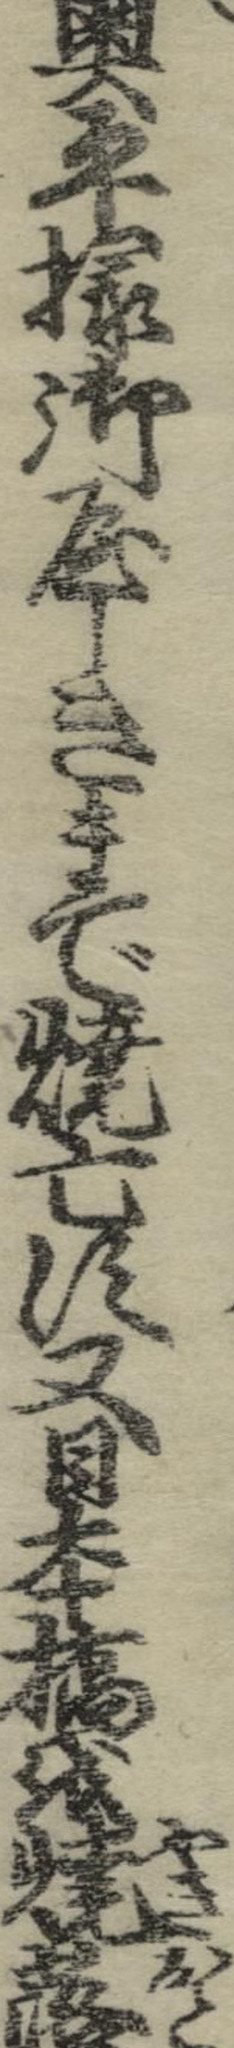奥平様御屋しきまで焼亡す又日本橋を焼落し
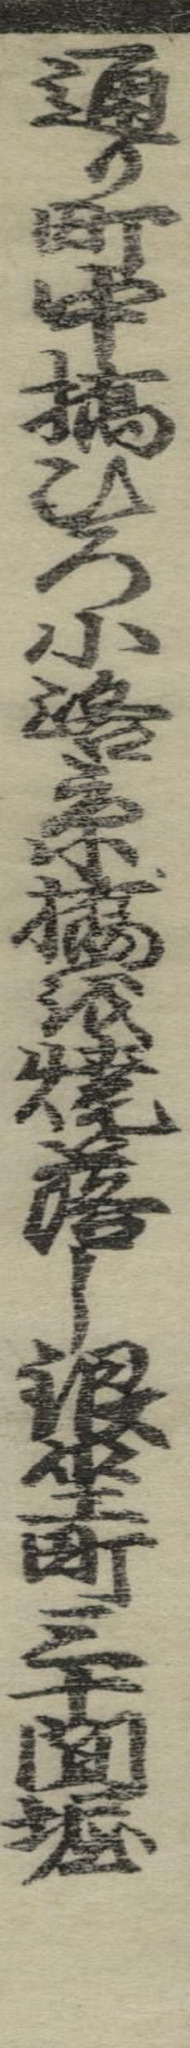通り町中橋ひろ小路京橋を焼落し銀坐町三十間堀
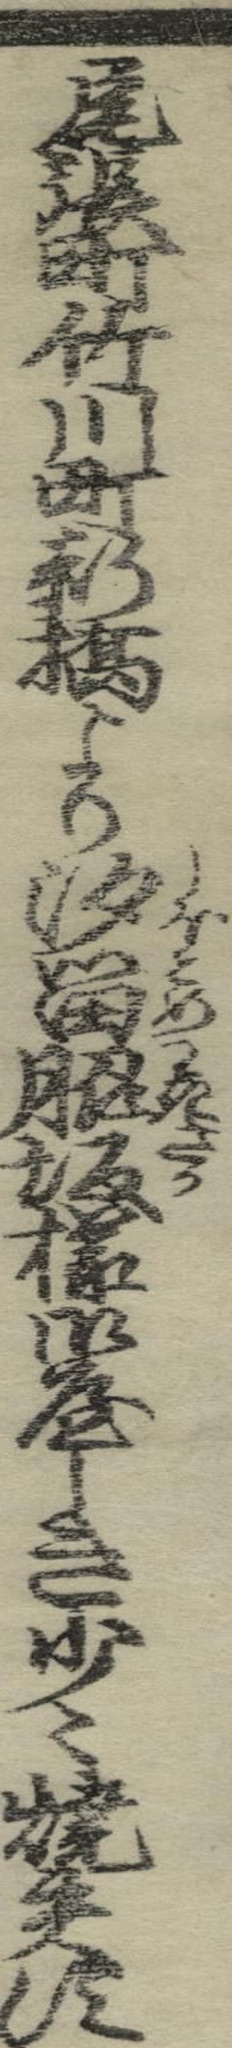尾張町竹川町新橋より汐留脇坂様御屋しき少々焼失す
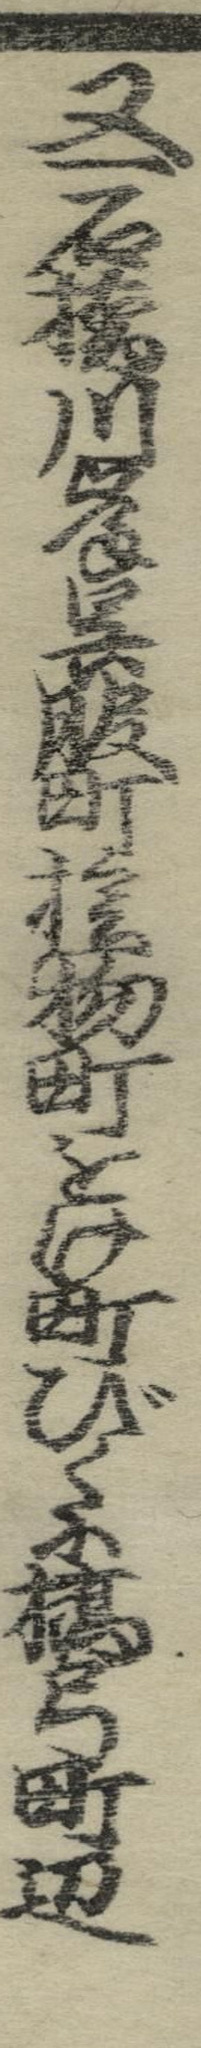又一石橋川岸呉服町檜物町をけ町びくに町弓町辺
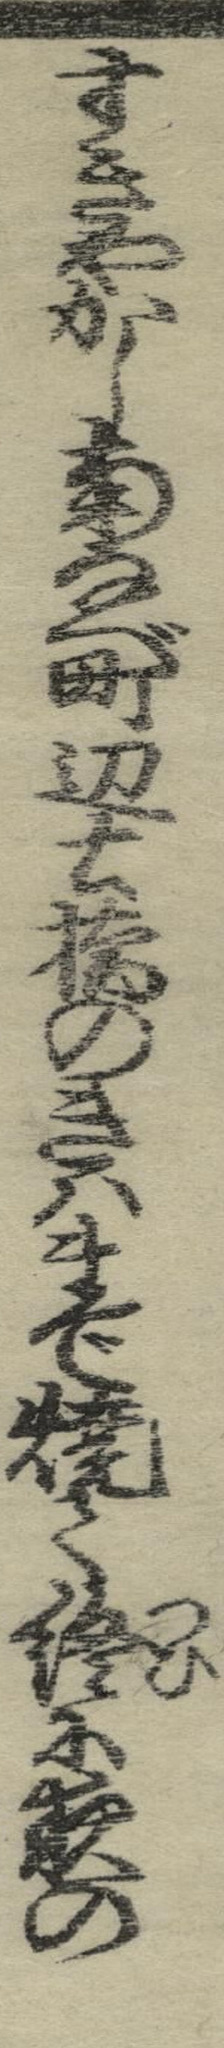すきやかし南なべ町辺土橋のきはまで焼て終に夜の
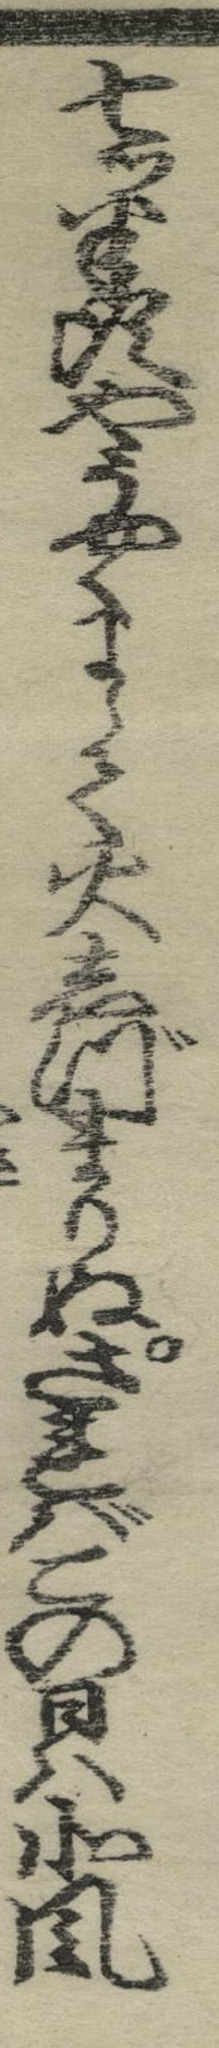七ッ半頃やうやくにて火しづまりぬ。さればこの日は北風
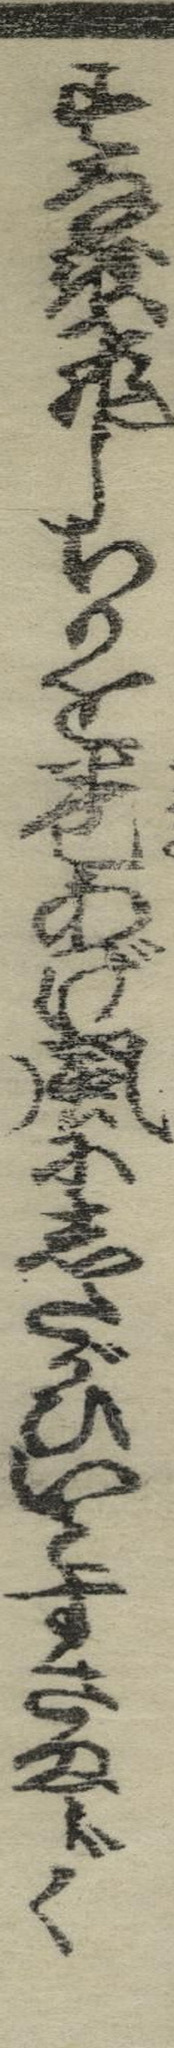すなを飛しちりを巻あげ風にしたがひいとすさまじく
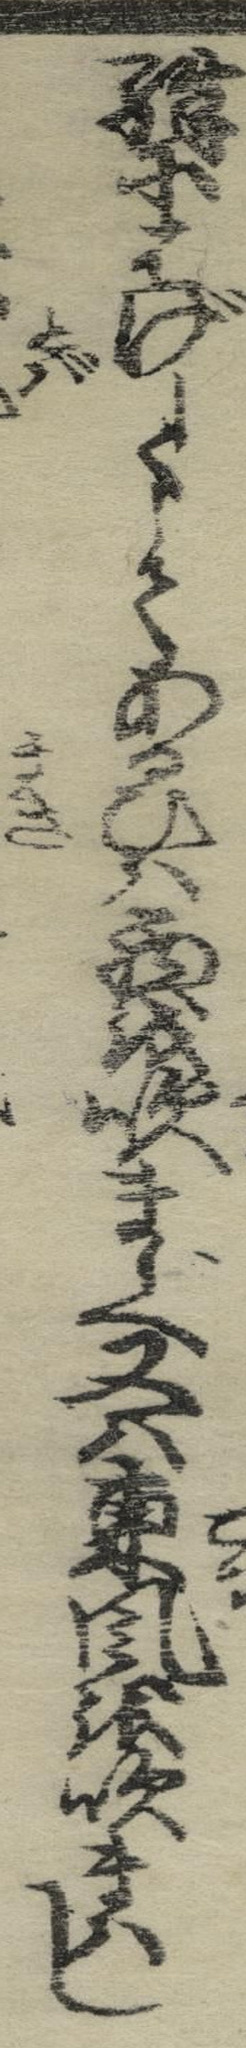殊にはげしくてあるひは西を吹まじへ又は東風を吹まはし
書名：[文政十二年三月の江戸大火に関する瓦版]
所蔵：東京大学地震研究所図書室 Earthquake Research Institute Library, The University of Tokyo, JAPAN
